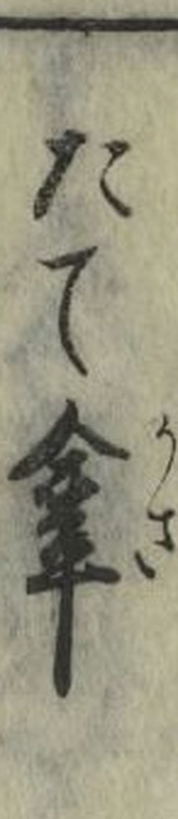たて傘
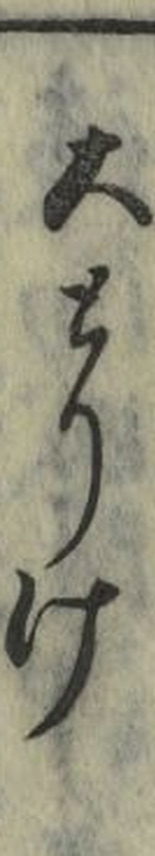大とりけ
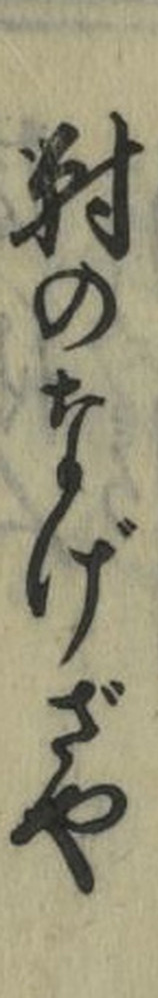對のなげざや
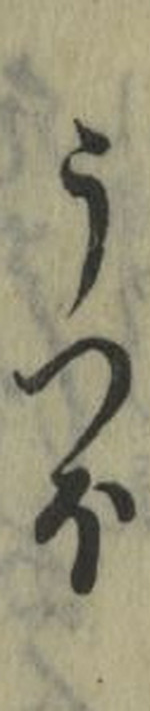うつほ

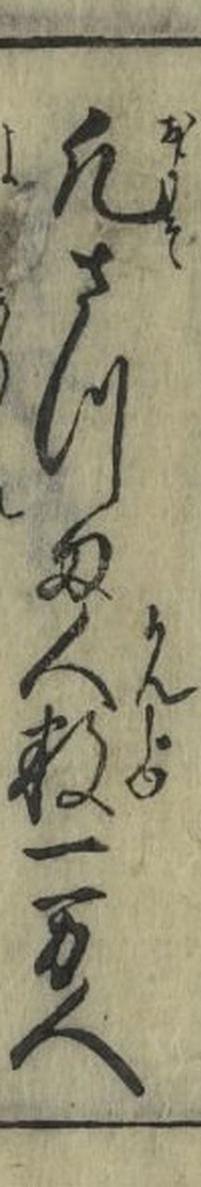凡さつま人数一万人
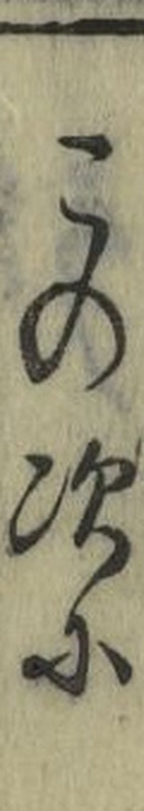この次に
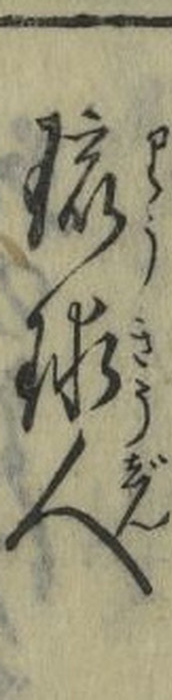琉球人
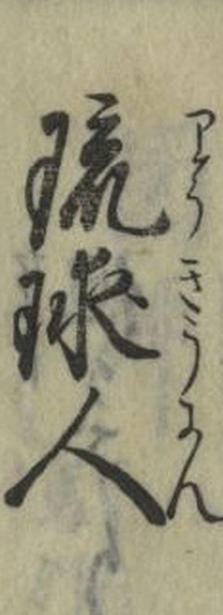琉球人
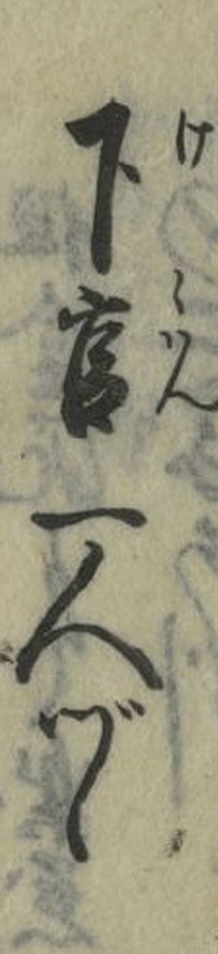下官一人づゝ

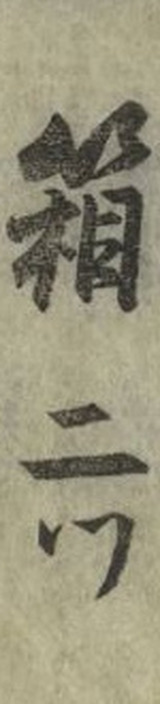箱二つ
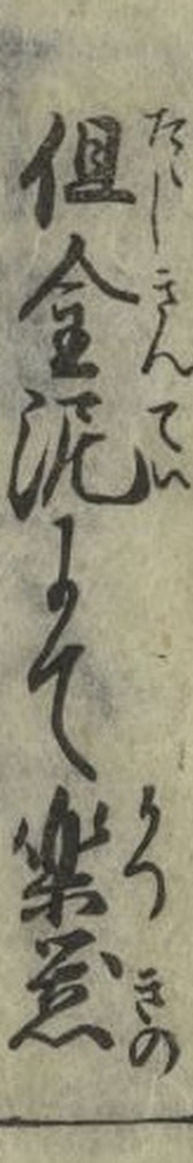但金泥にて楽器
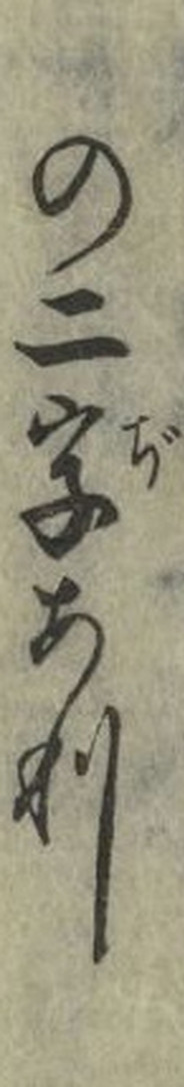の二字あり
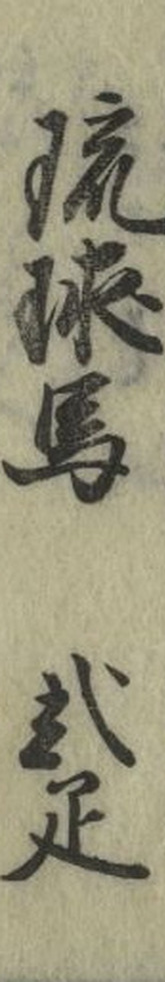琉球馬弐疋
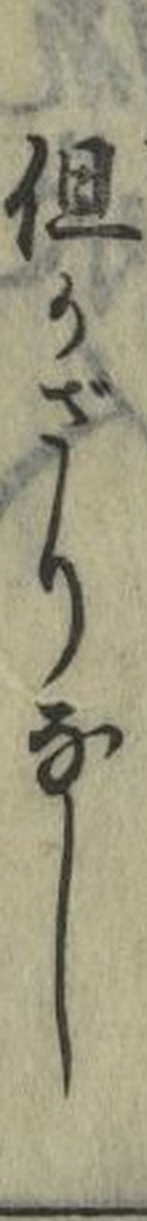但かざりなし
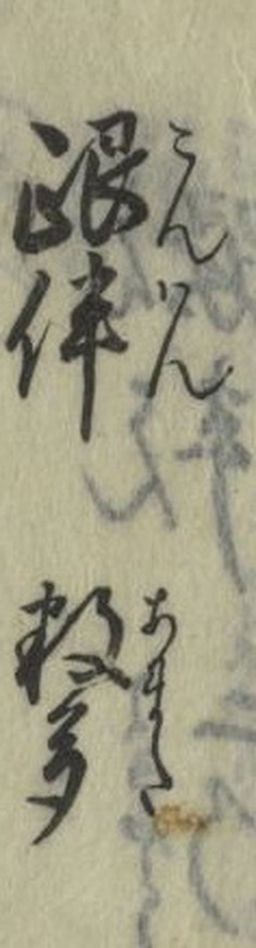跟伴数多
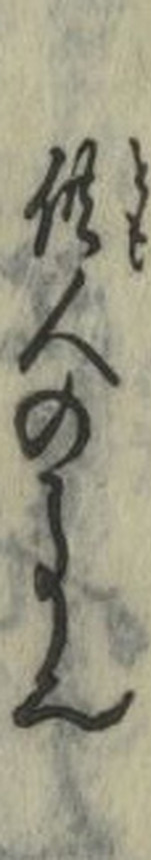供人の事也
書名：琉球人大行列記
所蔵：University of the Ryukyus Library
